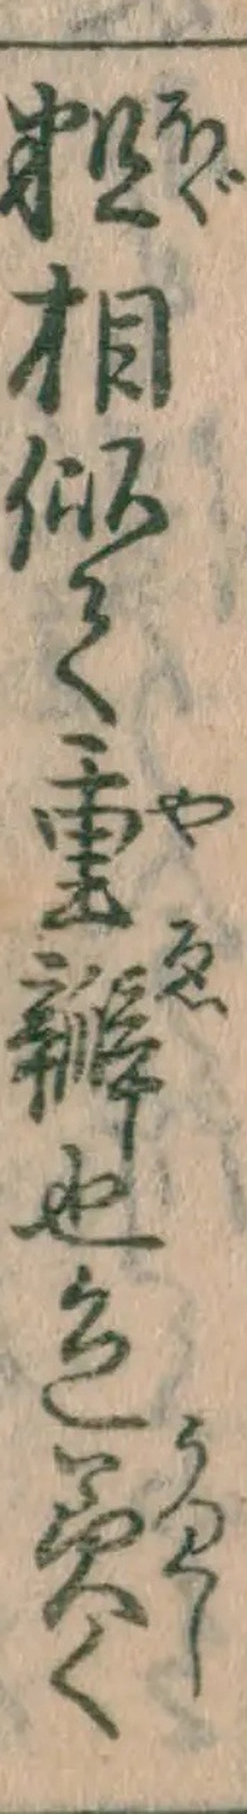粗相似て重弁也色美く
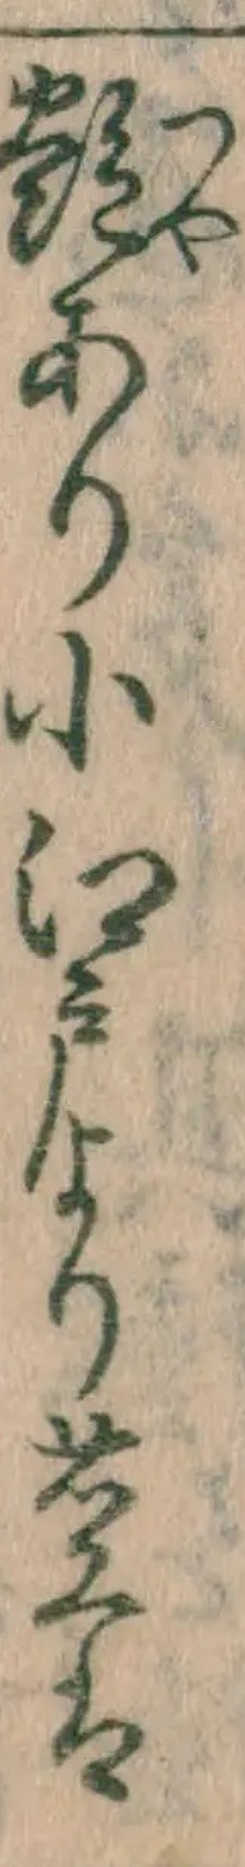艶あり小江戸より茎は
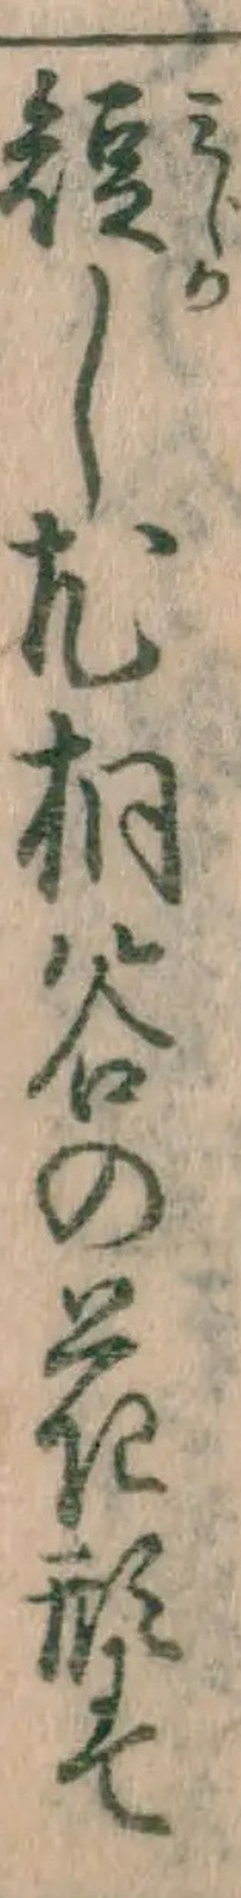短し尤桐谷の花形にて
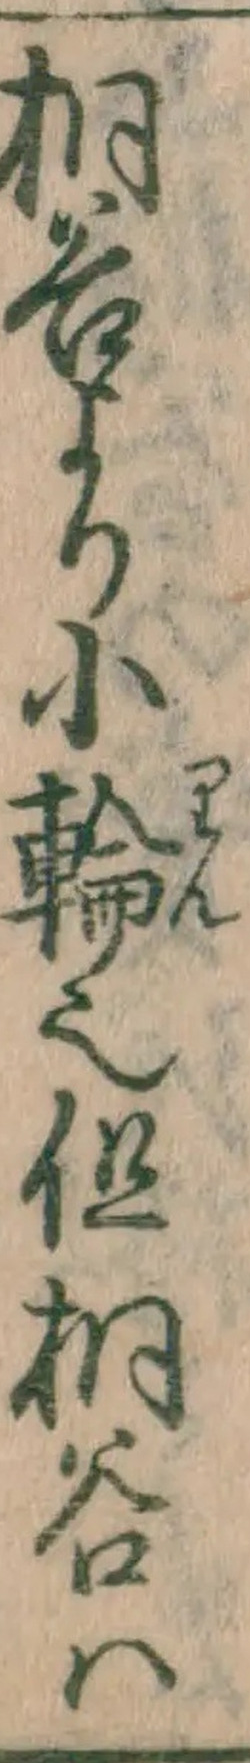桐谷より小輪也但桐谷は
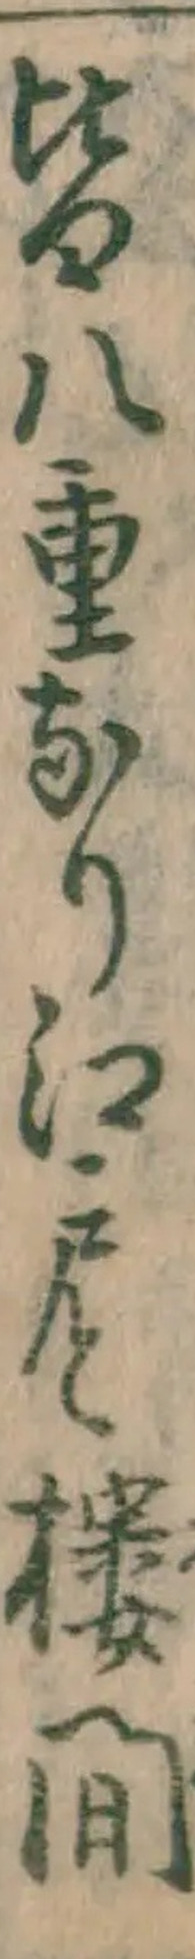皆八重なり江戸と楼間

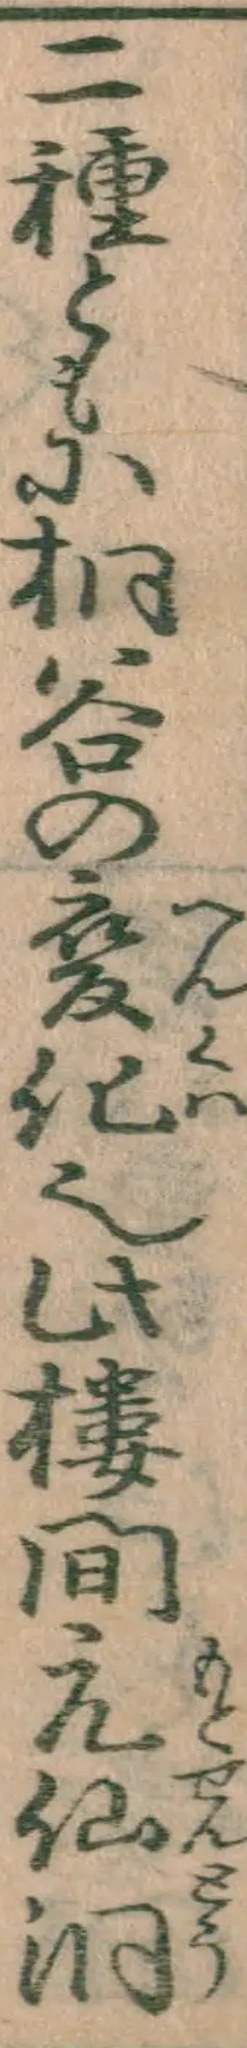二種ともに桐谷の変化也此楼間元仙洞
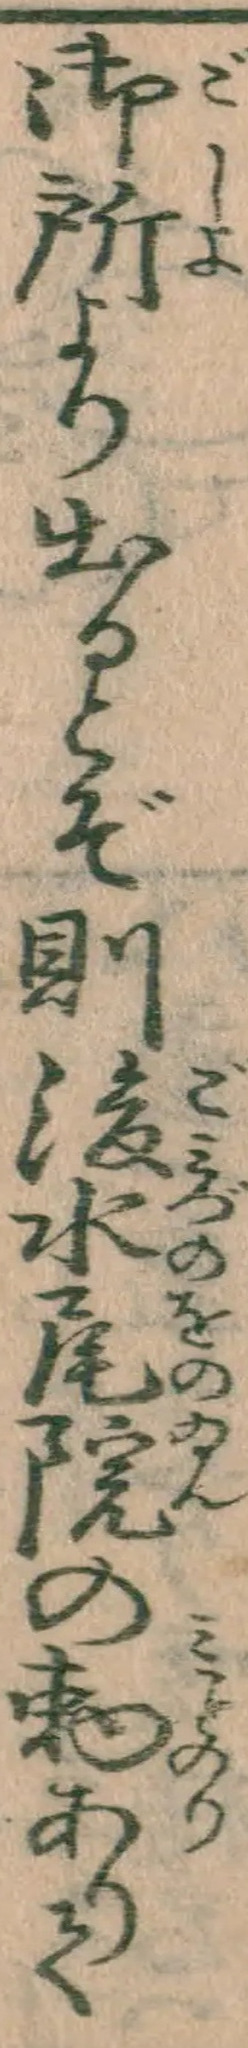御所より出るとぞ則後水尾院の勅ありて
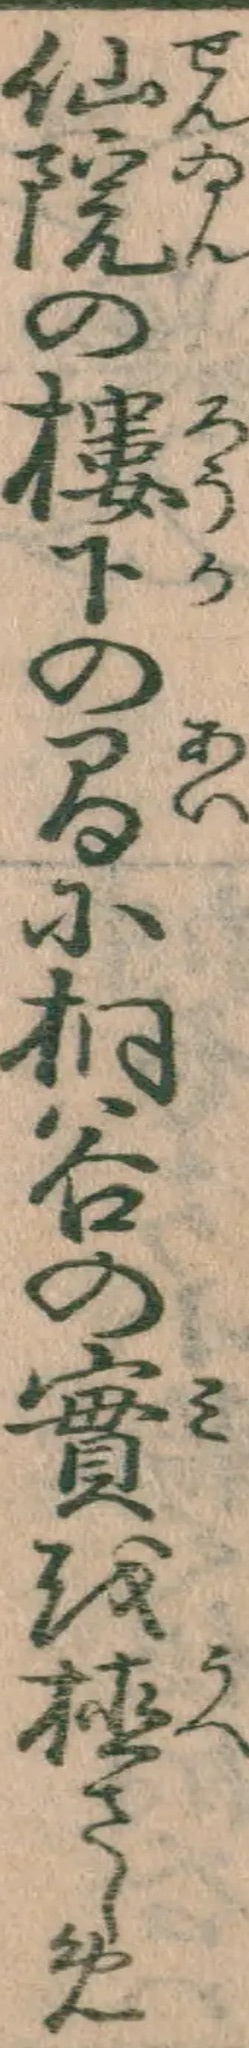仙院の楼下の間に桐谷の実を植さしめ
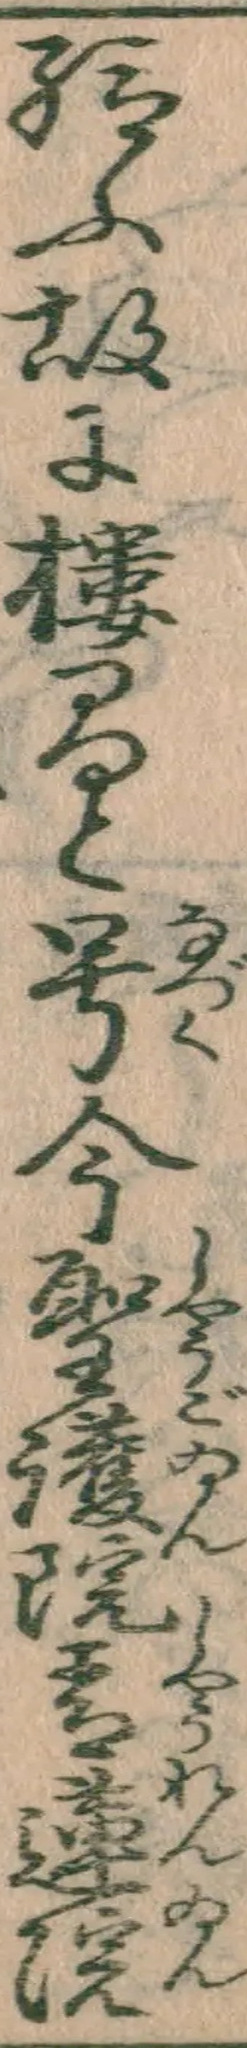給ふ故に楼間と号今聖護院青蓮院
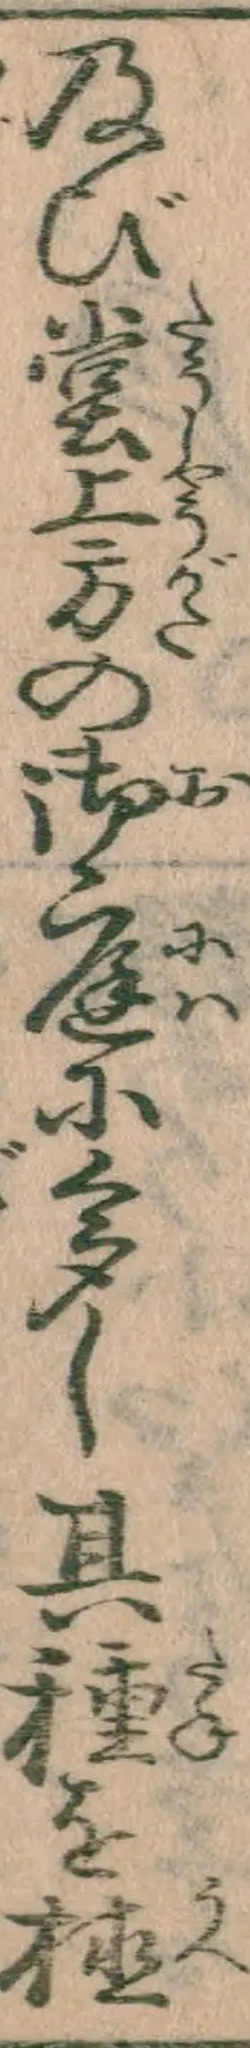及び堂上方の御庭に多し其種を植
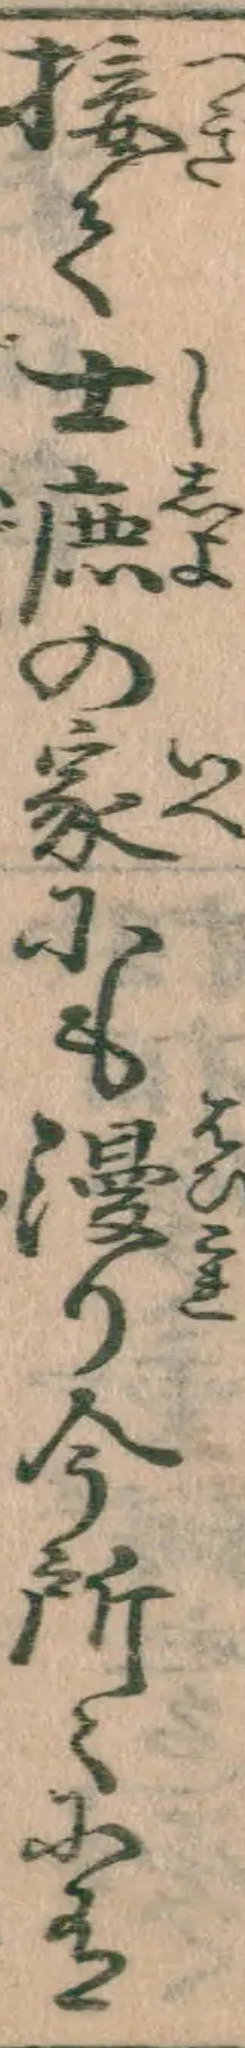接て士庶の家にも漫り今所々に有
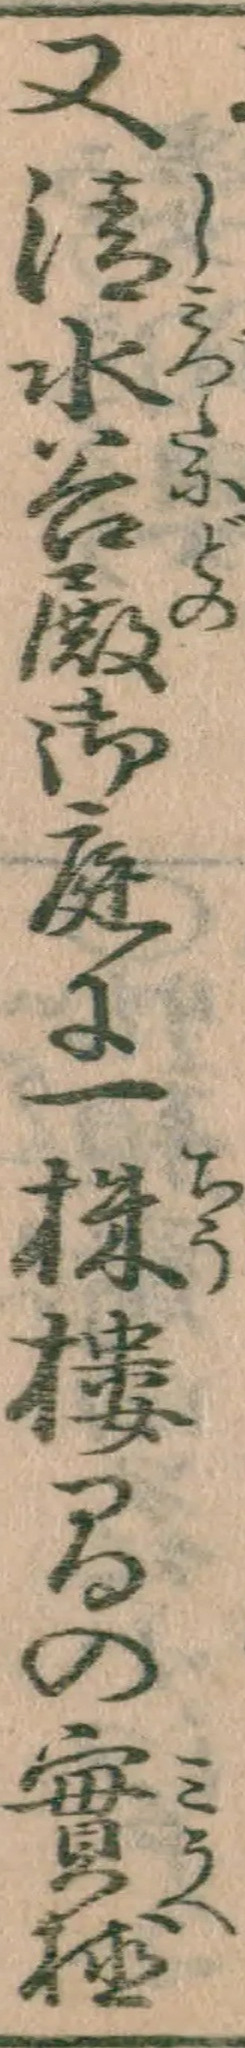又清水谷殿御庭に一株楼間の実植
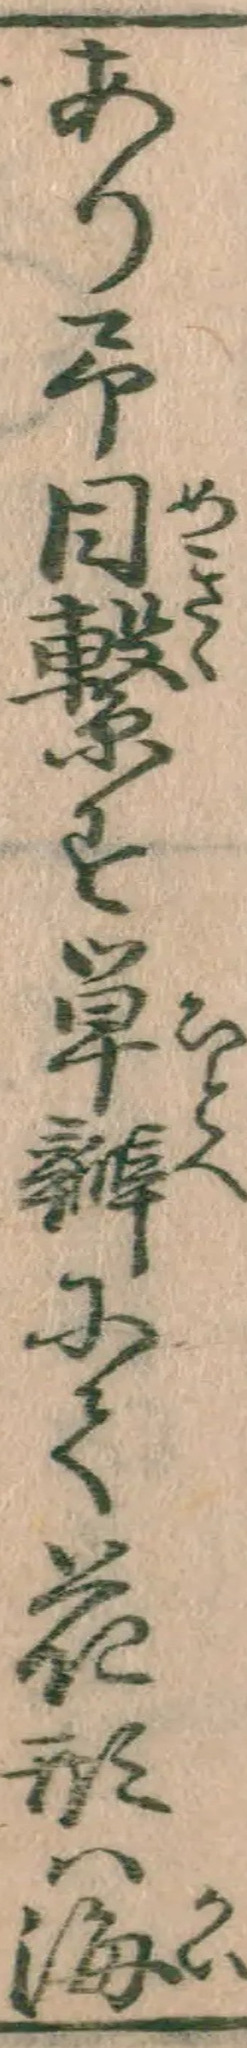あり予目繋す単弁にて花形は海
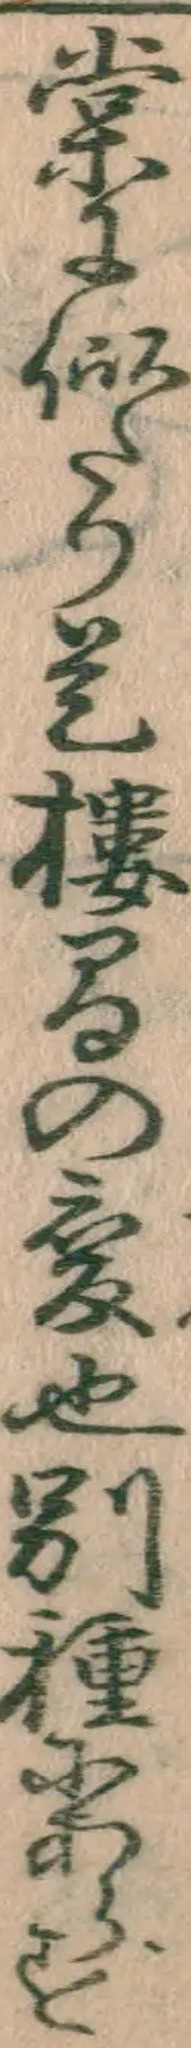棠に似たり是楼間の変也別種にあらす

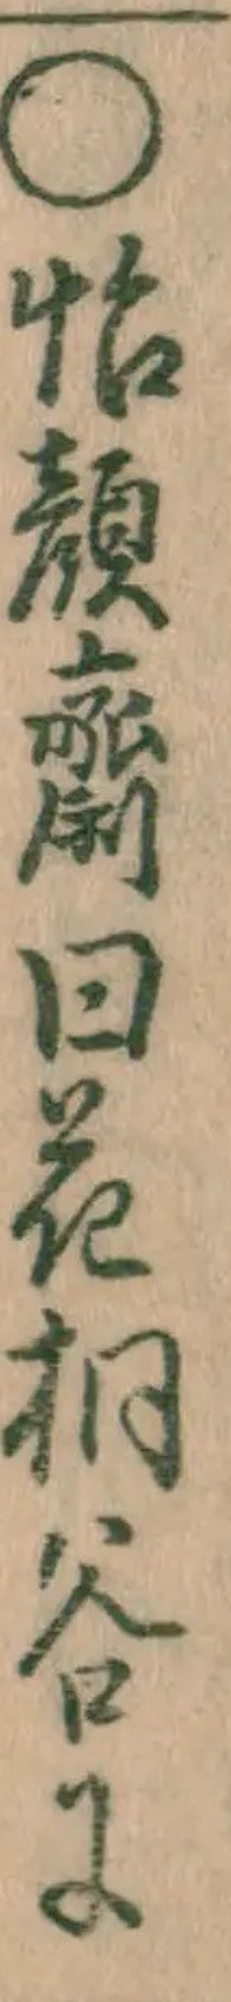○怡顔斎曰花桐谷に
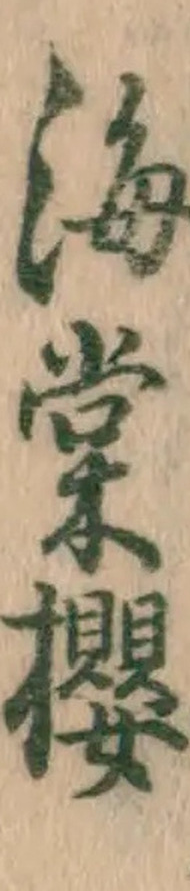海棠桜
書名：怡顔齋櫻品
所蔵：国立国会図書館 National Diet Library, JAPAN
